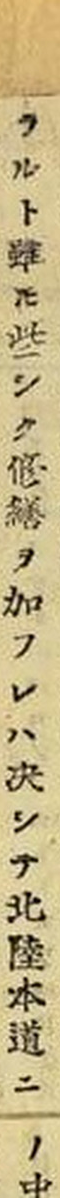ラルト雖𪜈些シク修繕ヲ加フレハ決シテ北陸本道ニ
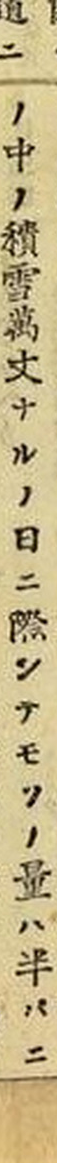ノ中ノ積雪萬丈ナルノ日ニ際シテモソノ量ハ半バニ
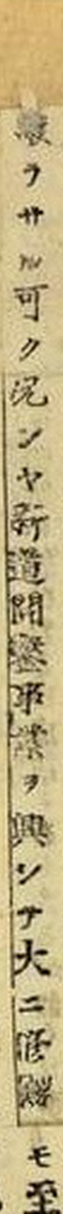敷ラサル可ク况ンヤ新道開鑿事業ヲ興シテ大ニ修繕
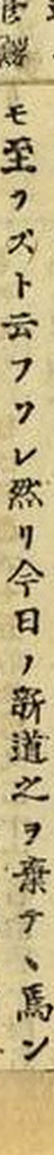モ至ラズト云フソレ然リ今日ノ新道之ヲ棄テヽ馬ン
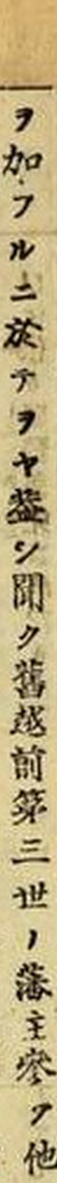ヲ加フルニ於テヲヤ蓋シ聞ク舊越前大三世ノ藩主參
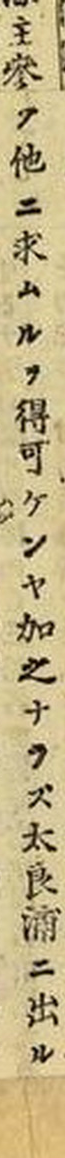ゾ他ニ求ムルヲ得可ケンヤ加之ナラズ太良浦ニ出ル
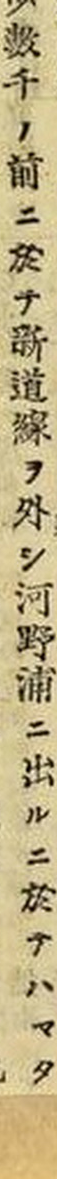ノ前ニ於テ新道線ヲ外シ河野浦ニ出ルニ於テハマタ
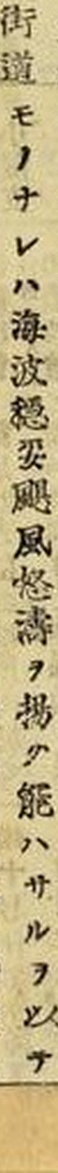モノナレハ海波穏妥颶風怒濤ヲ揚グ能ハサルヲ以テ
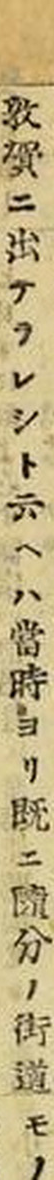敦賀ニ出ナラレシト云ヘハ當時ヨリ既ニ隨分ノ街道
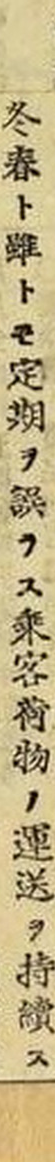冬春ト雖トモ定期ヲ誤ラス乗客荷物ノ運送ヲ持續ス
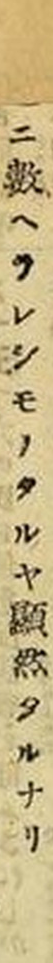ニ數ヘラレシモノタルヤ顯然タルナリ
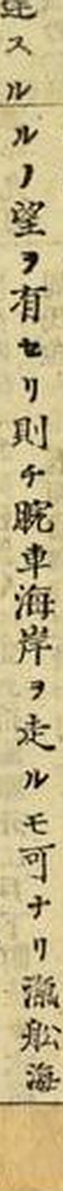ルノ望ヲ有セリ則チ腕車海岸ヲ走ルモ可ナリ滊舩海
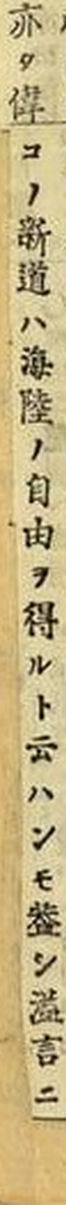コノ新道ハ海陸ノ自由ヲ得ルト云ハンモ蓋シ溢言ニ
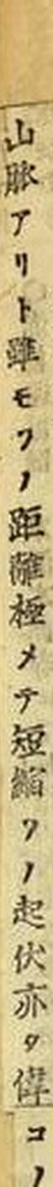山脈アリト雖モソノ距離極メテ短縮ソノ起伏亦タ得
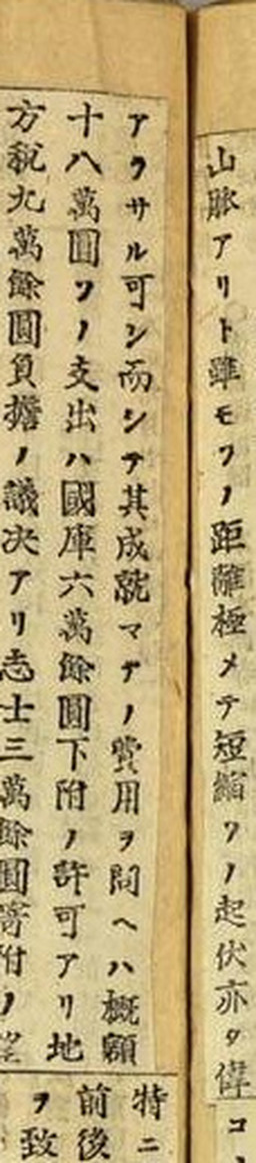アラサル可シ而シテ其成就マデノ費用ヲ問ヘハ概額
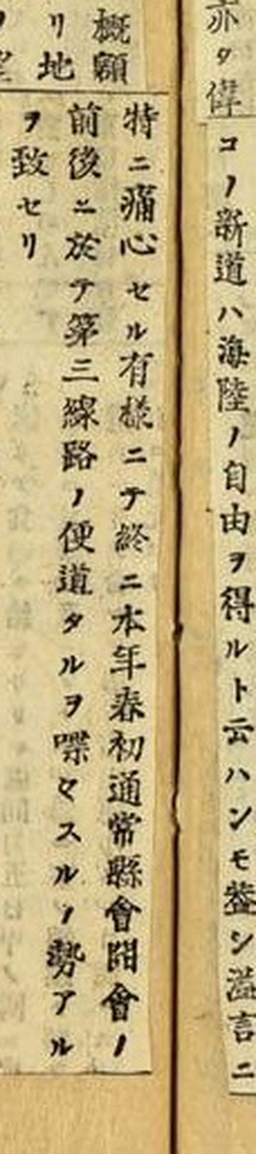特ニ痛心セル有様ニテ終ニ本年春初通常縣會開會ノ
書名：温古集 五巻
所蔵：福井県文書館 Fukui Prefectural Archives
